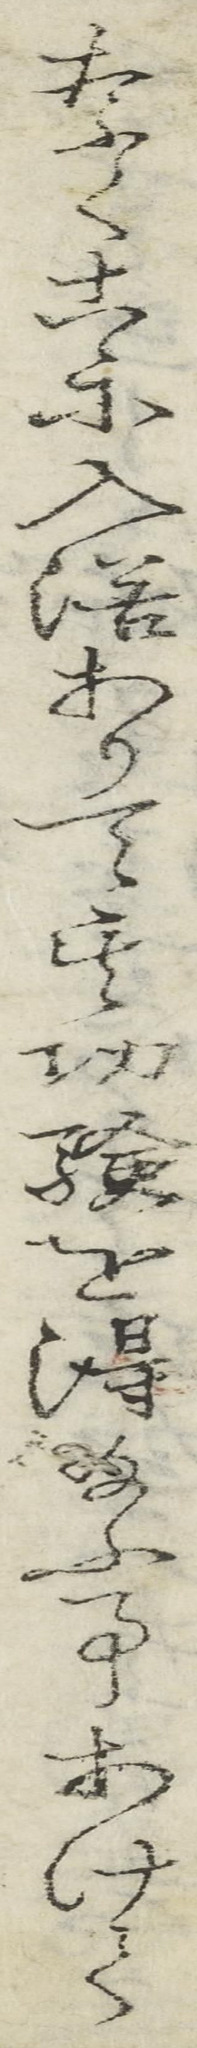なくこゝに入浴ありて其巧験を得給ふ事あけて
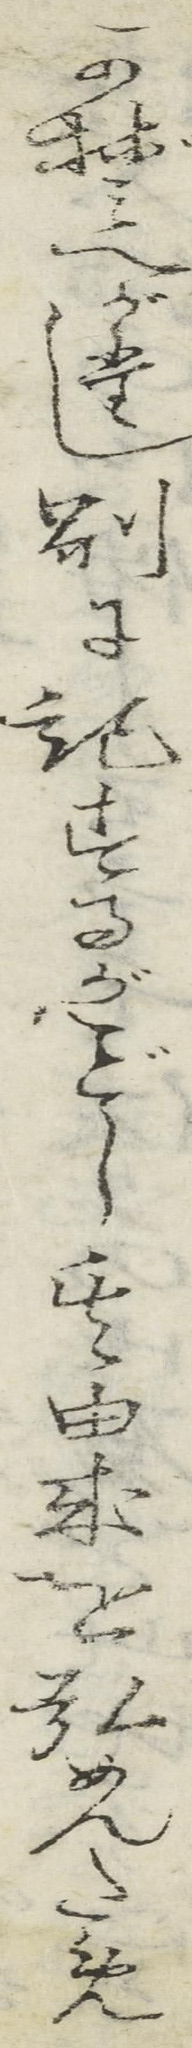かぞへがたし別に記するがごとし其由来を弘めんため
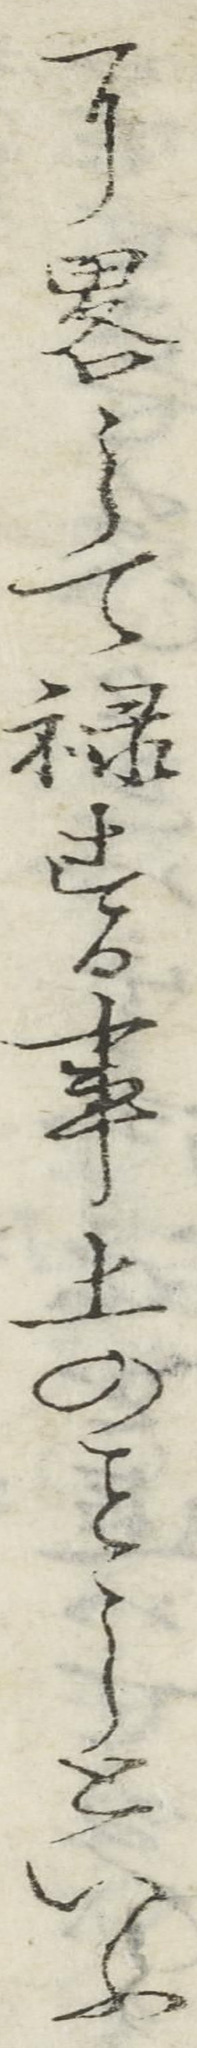に略して禄する事上のことしといふ
